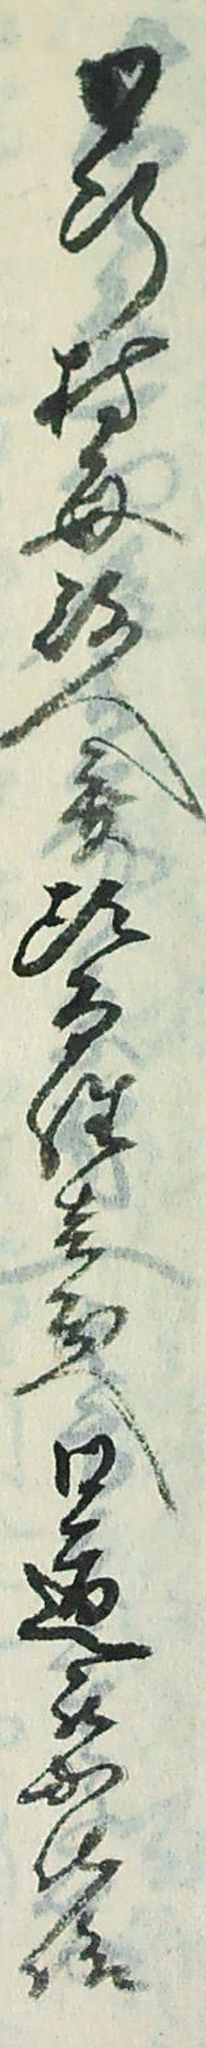同断村毎役人并頭百姓壱両人同道罷出仕様
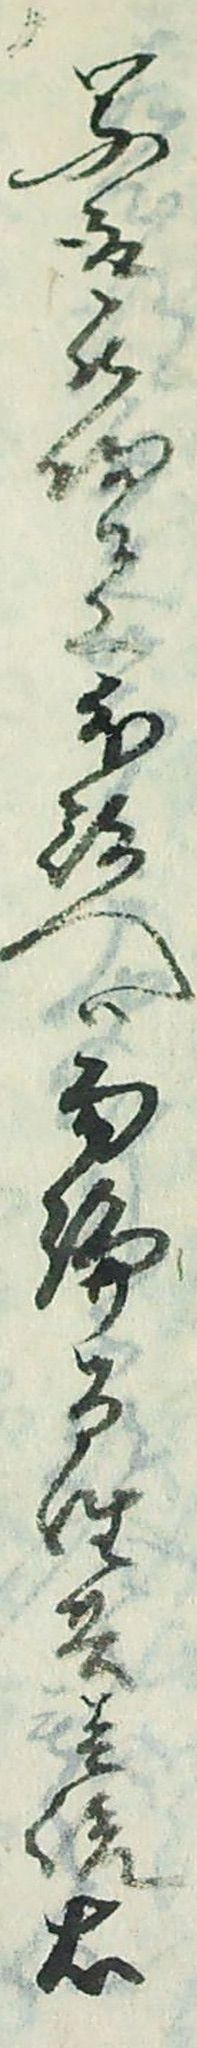写取罷帰候上外役人ハ勿論百姓共壱統右
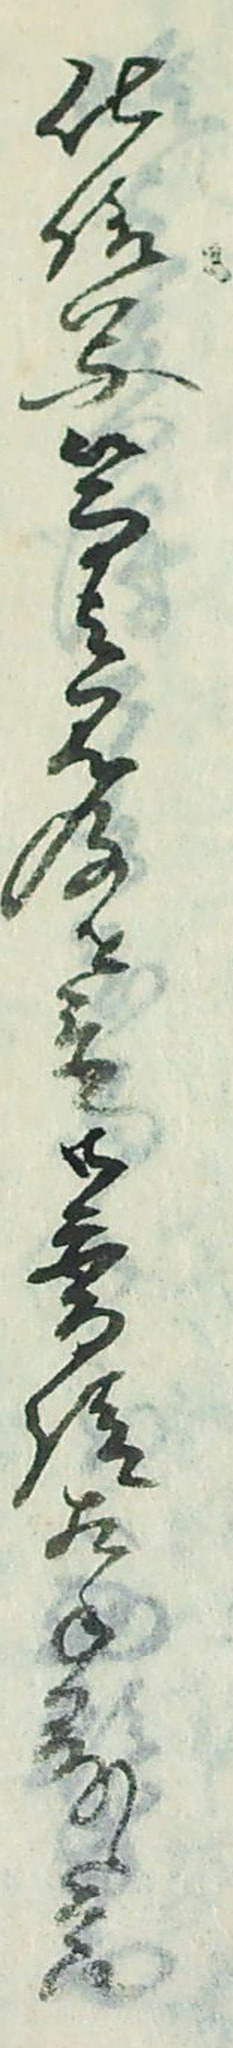仕様写篤と見及せ置御普請相手懸候節
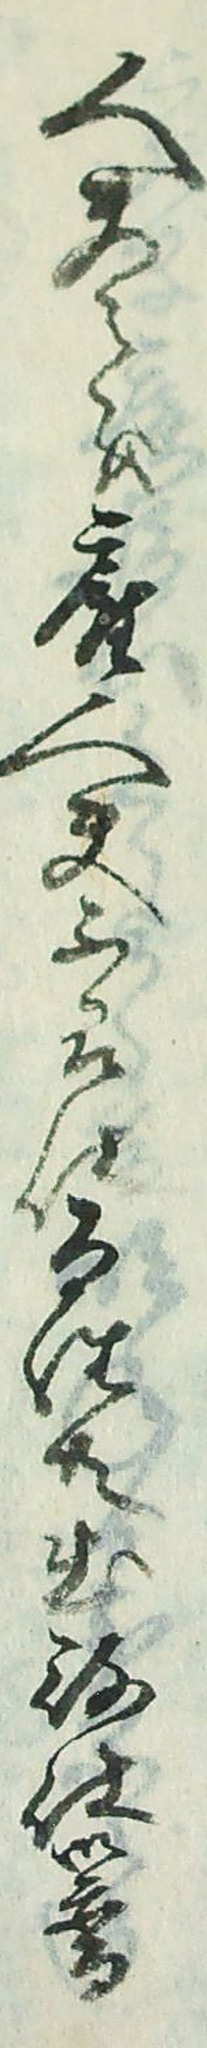人夫之義雇人夫不召仕百姓共出役仕御普
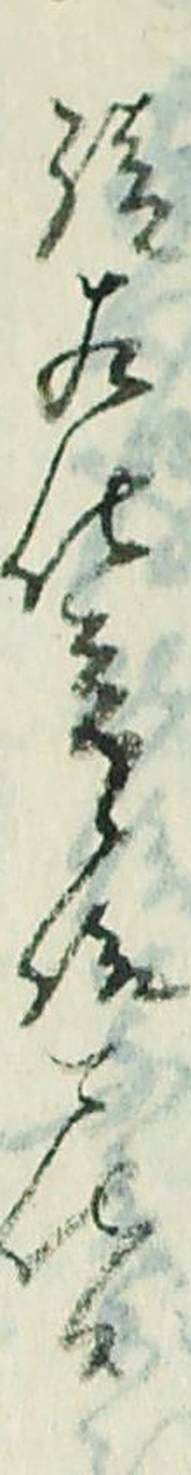請相仕立候様可仕候
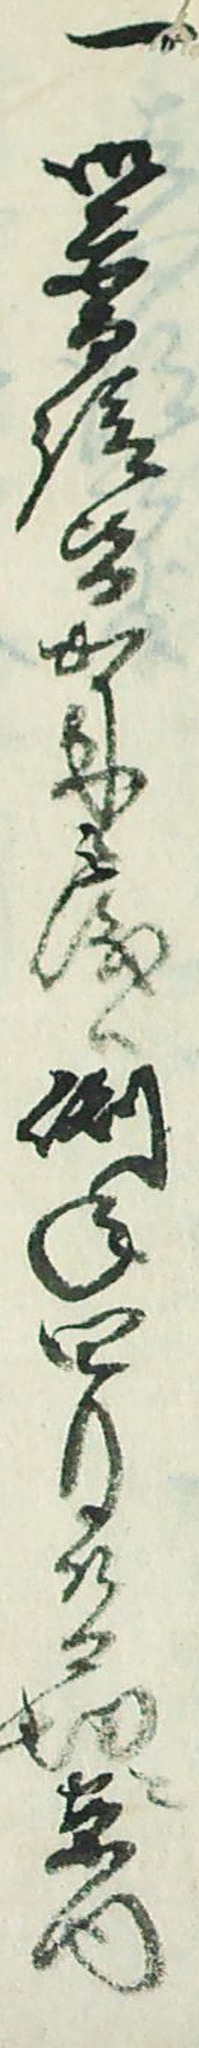一御普請皆出来候儀ハ例年四月廿日切ニ案内
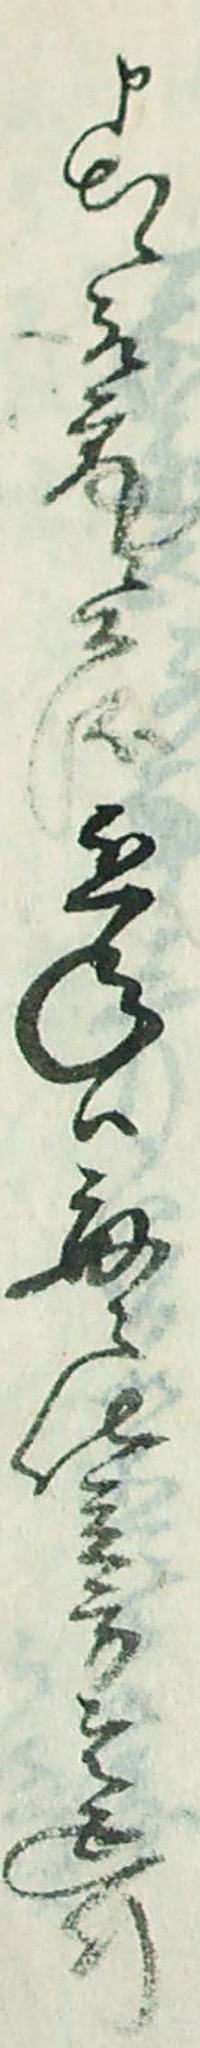申出候取究ニ候所近年ハ毎々仕立方先延引

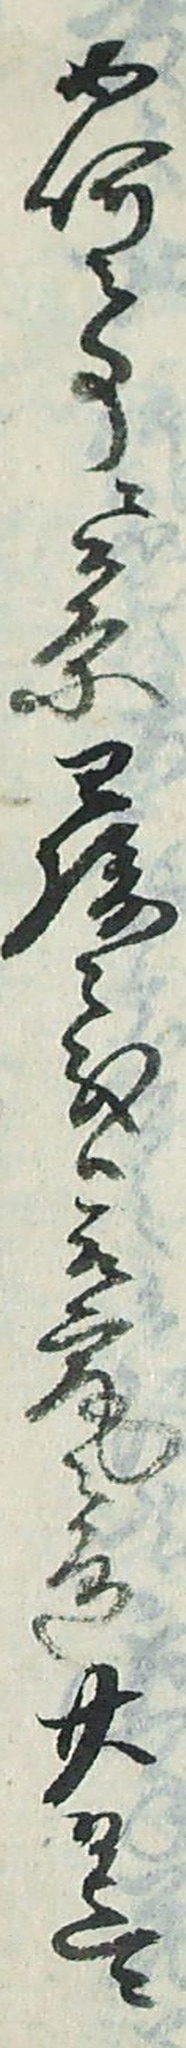如何之事ニ候条已後之義ハ取究之通廿日迄ニ
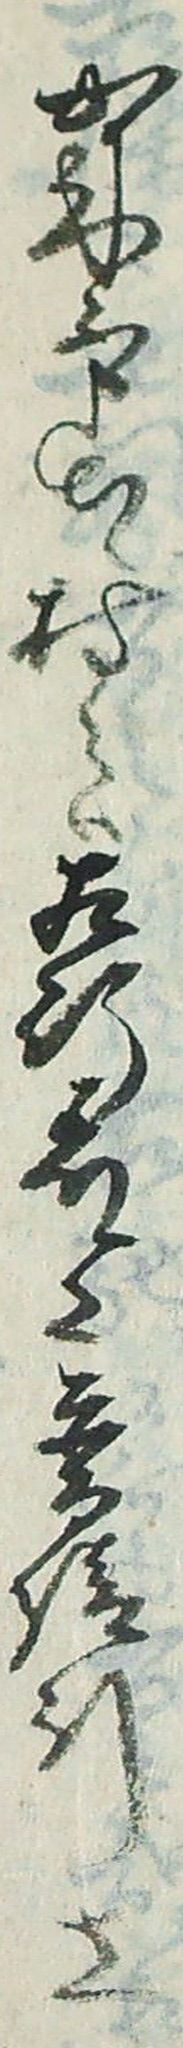出来不申出候村々ハ相行着候之普請引上
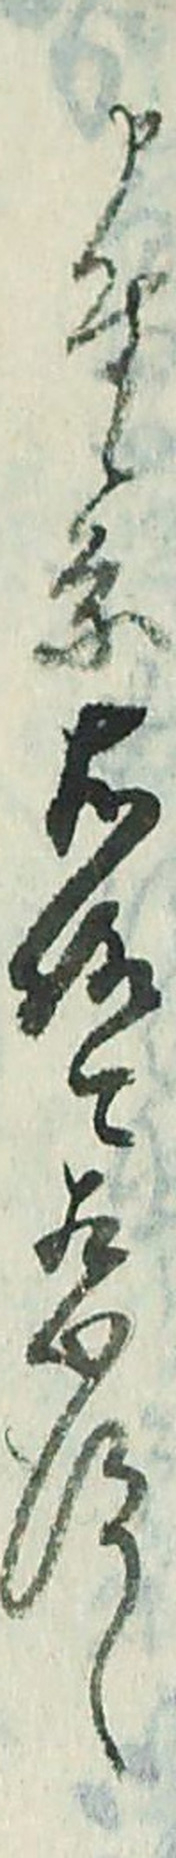申付候条右様可相心得候
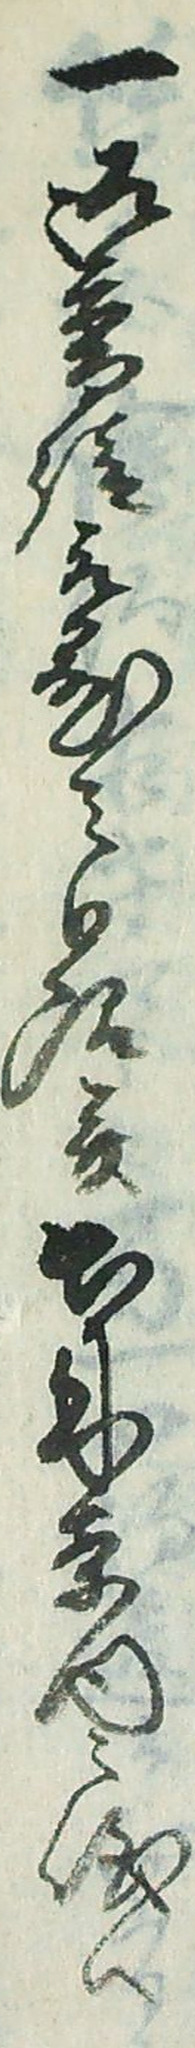一御普請取懸之日限幷出来案内之儀ハ
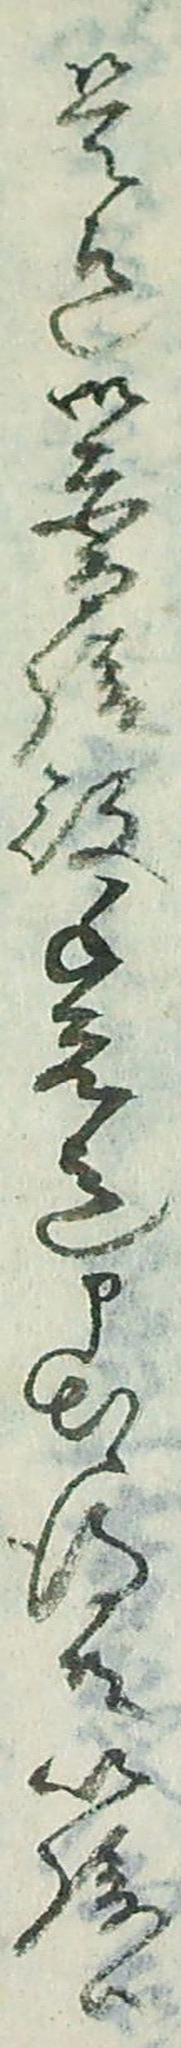是迄御普請役手元迄申出候得共以後ハ
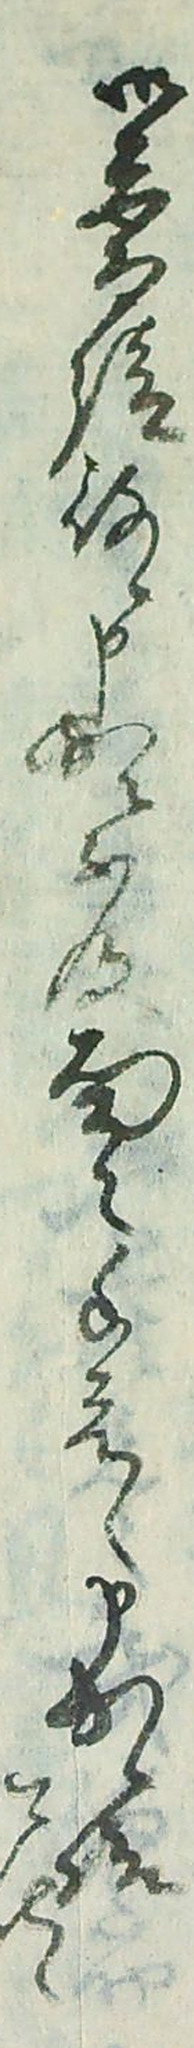御普請役へ申出ニ不及面々手元へ申出候様可仕候
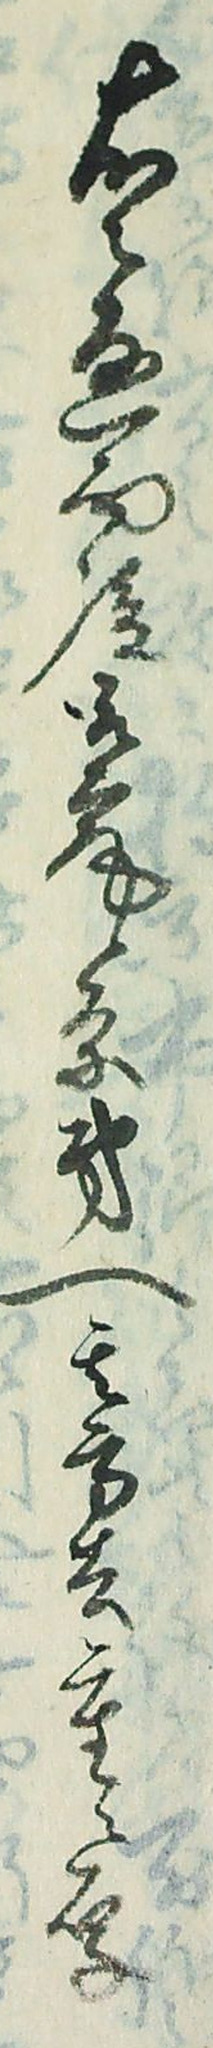右之通向後取究候条第一其方共重々厚
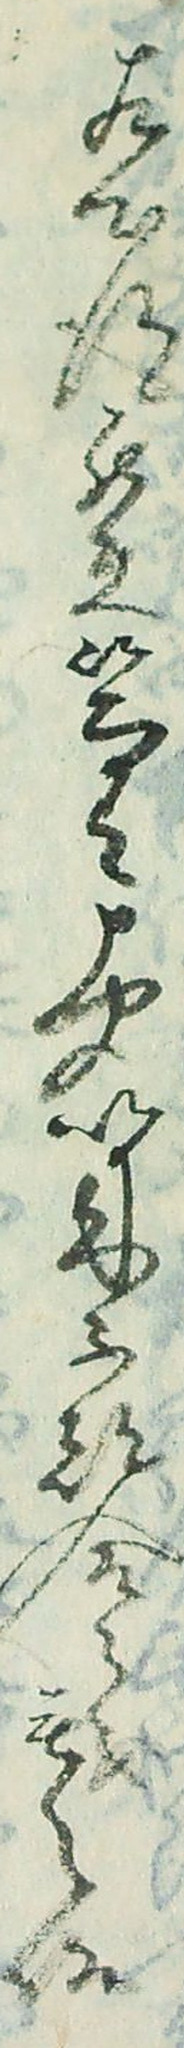相心得罷在篤と申聞以来不都合之義無之様
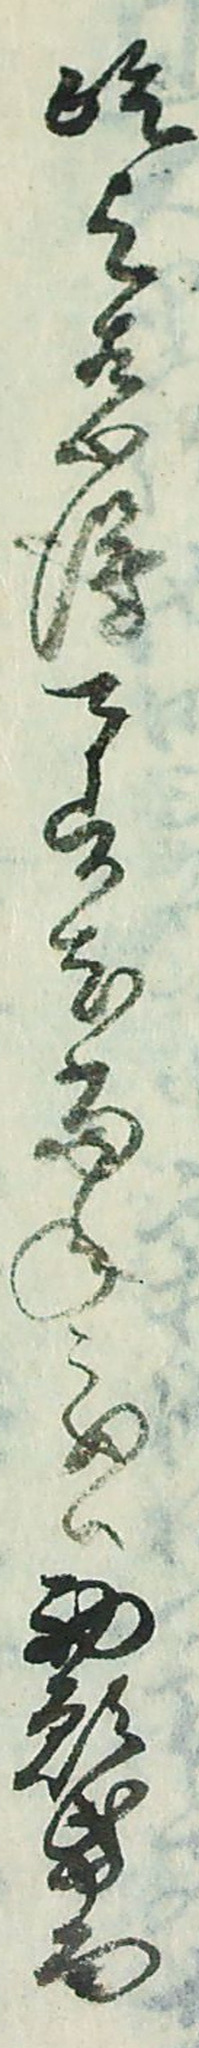屹と相心得可申候尤當年之義ハ初願帋面
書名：諸御趣意書并御下知向之写
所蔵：鳴門教育大学 Naruto University of Education
